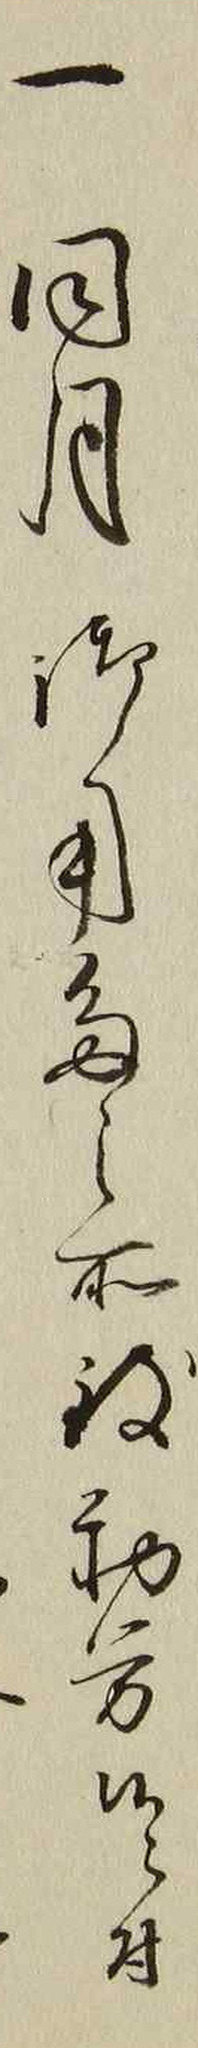一同月御用多々所致勤労候に付
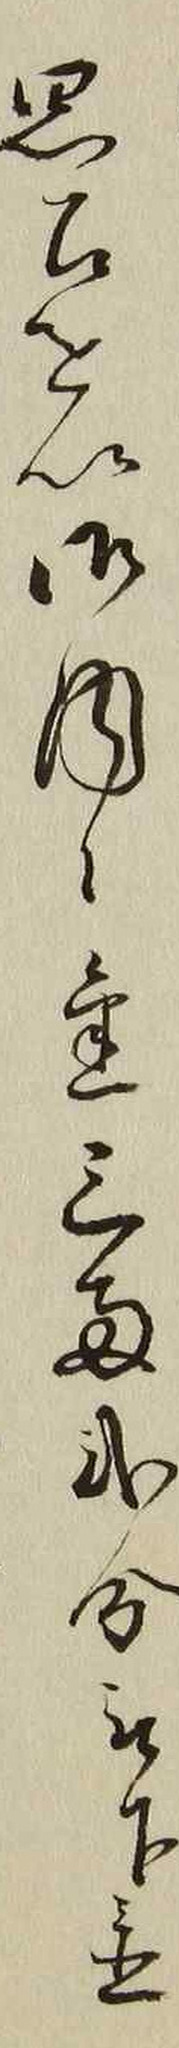思召を以御内々金三両弐分被下置
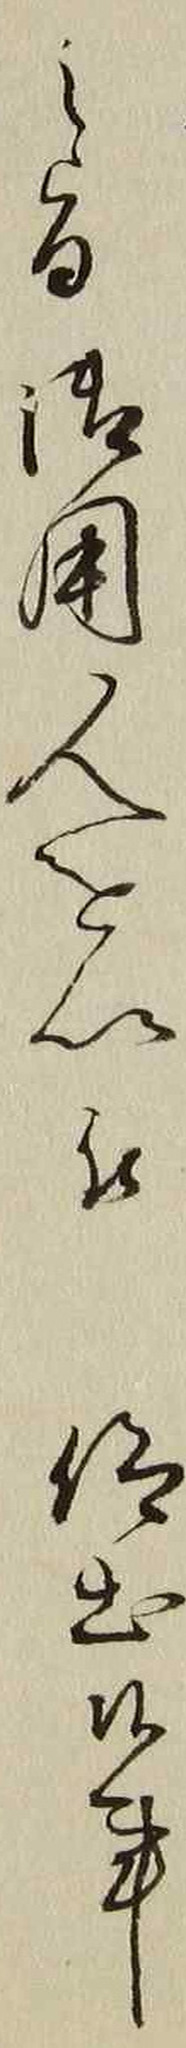の旨御用人を以被仰出候事
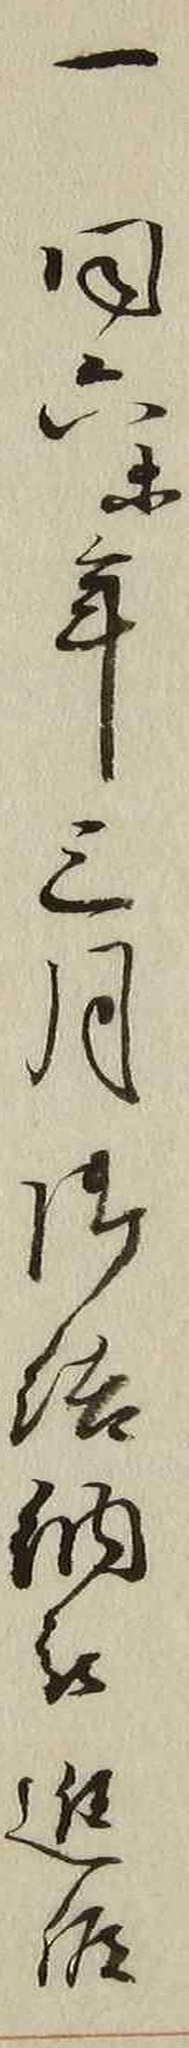一同六未年三月御結納被進候
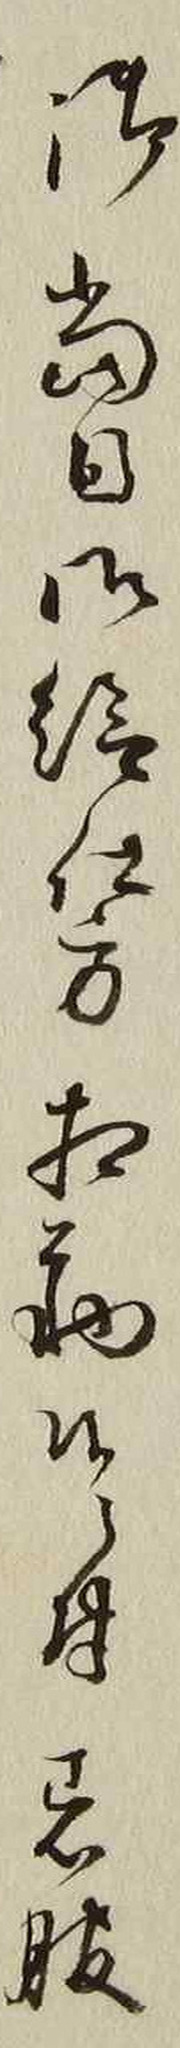御当日御給仕方相勤候に付着服
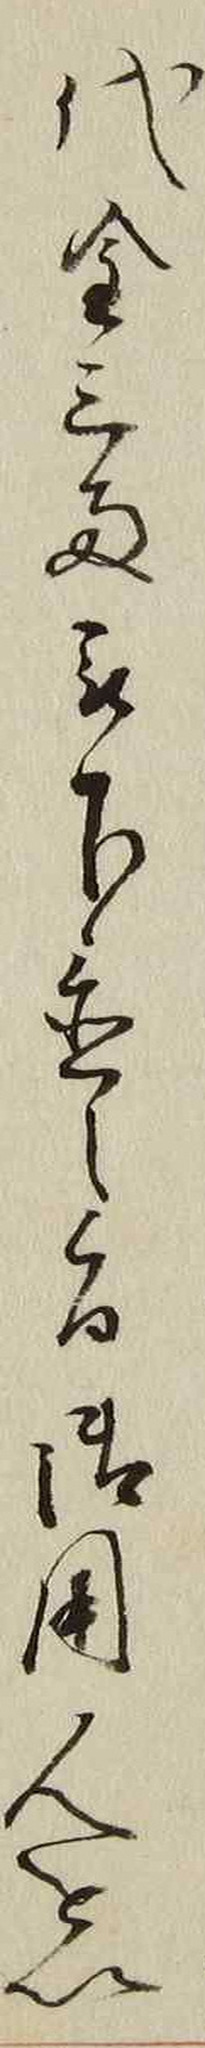代金三両被下置の旨御用人を以
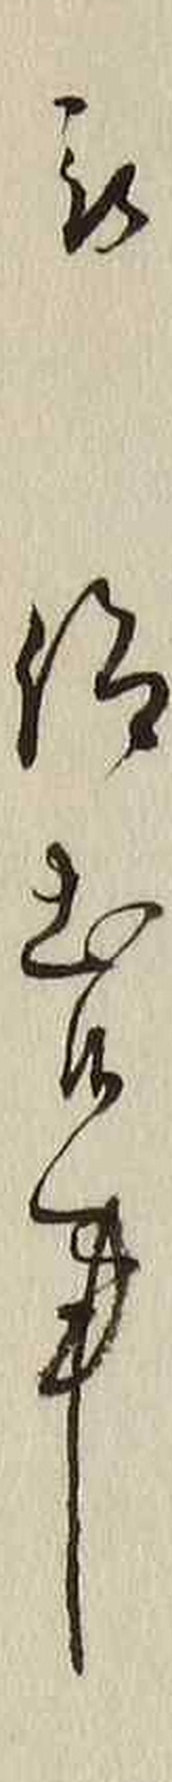被仰出候事
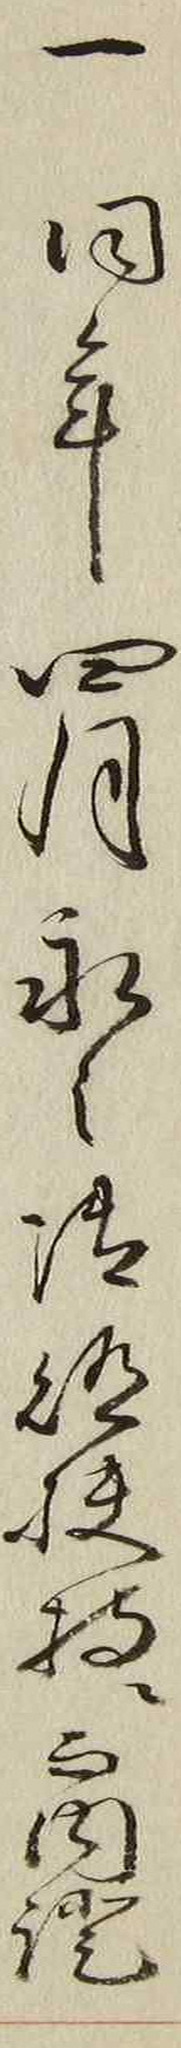一同年四月永々御賄扶持に而内証
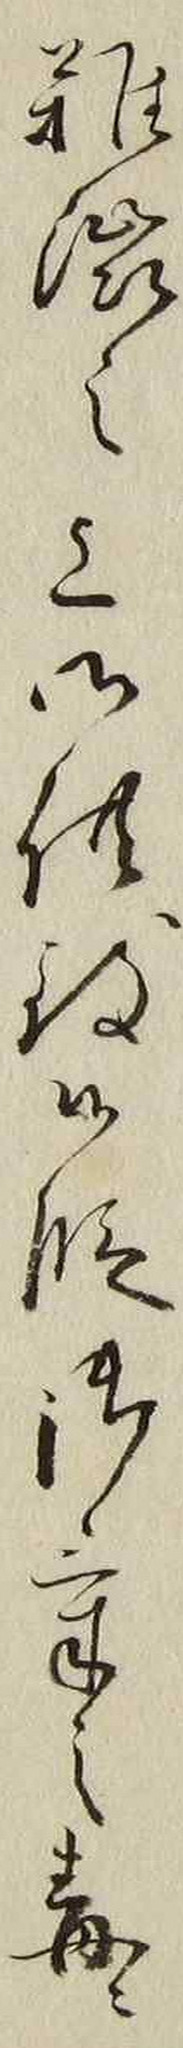難渋之上御供致候段御気の毒に
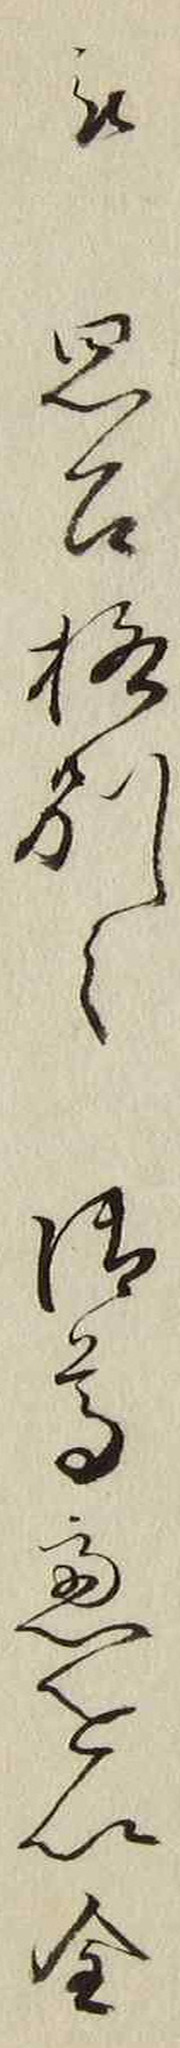被思召格別之御尊慮を以金
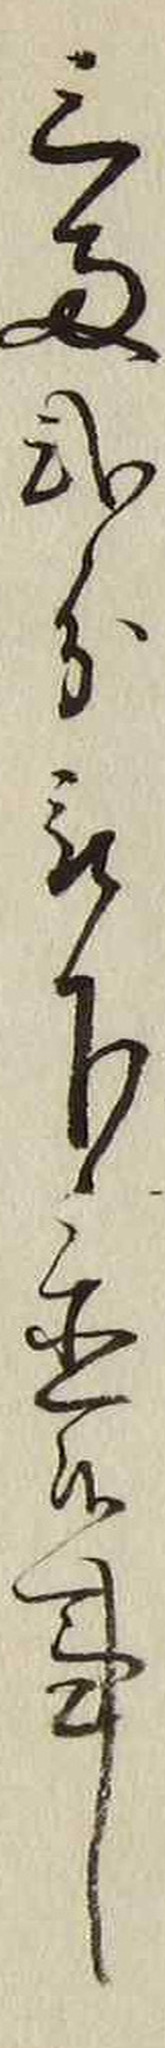三両弐分被下置候事
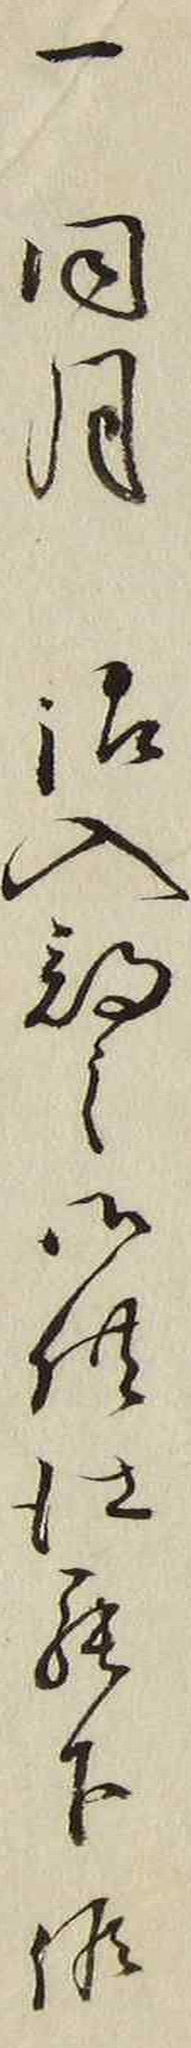一同月御入部の御供仕罷下候

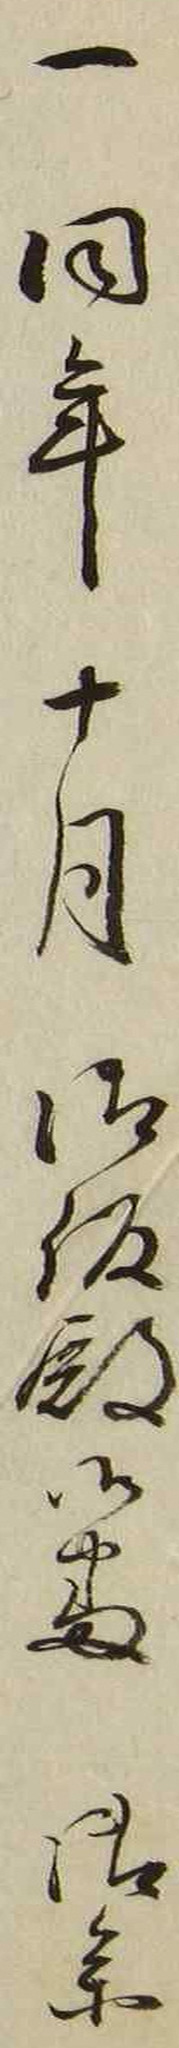一同年十月御仮殿御番御参
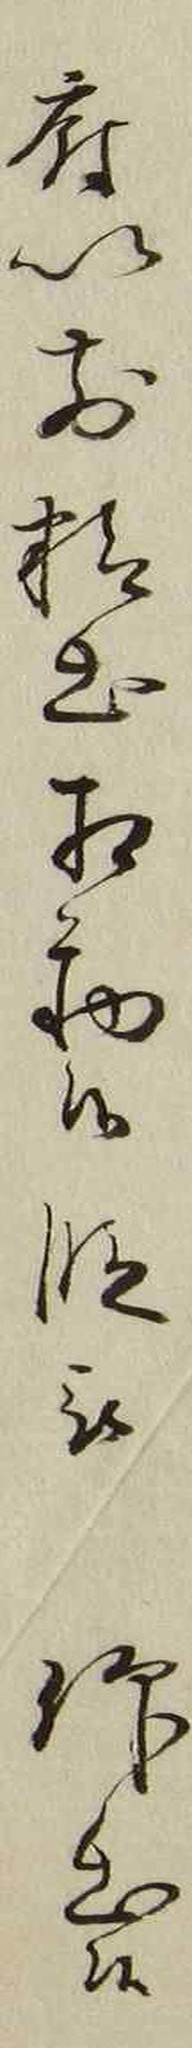府以前精出相勤候段被仰出候
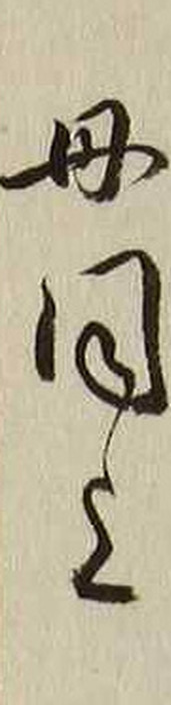母同上
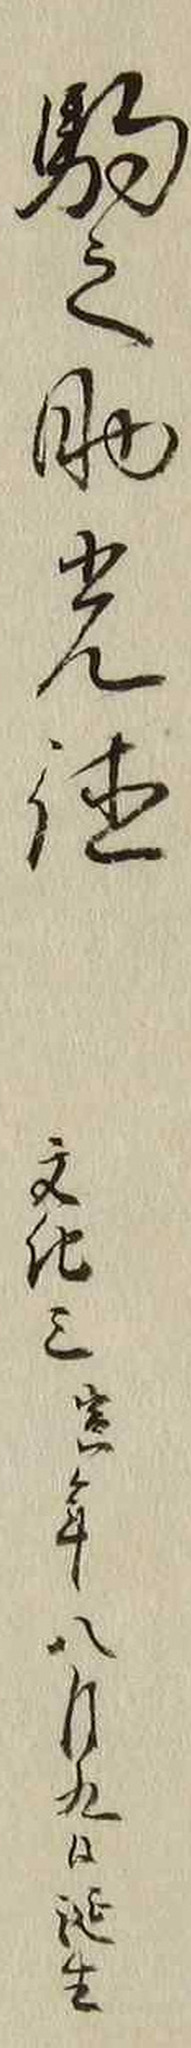駒之助光徳文化三寅年八月九日誕生
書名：諸士系譜　巻之1　い之部1
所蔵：会津若松市立会津図書館
